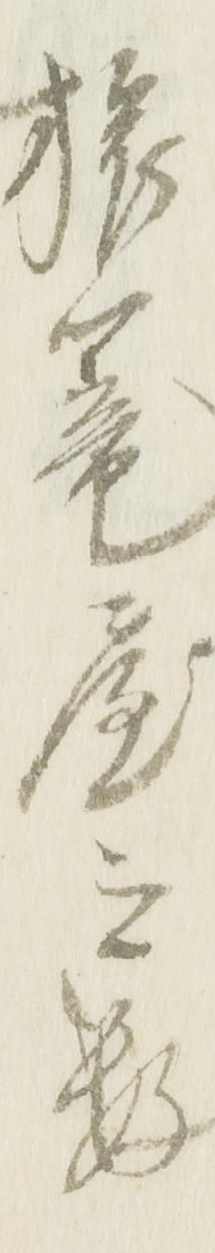旅籠屋之数
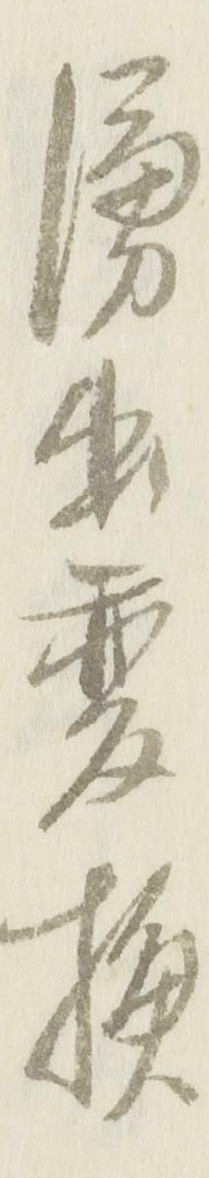湧出変換
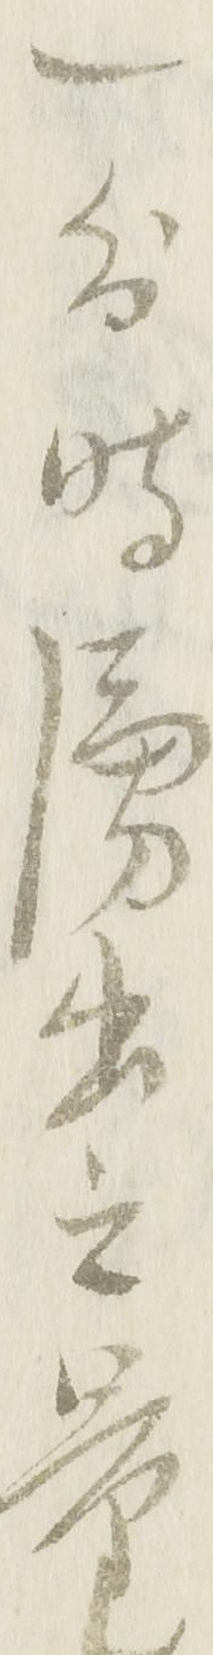一分時湧出之量
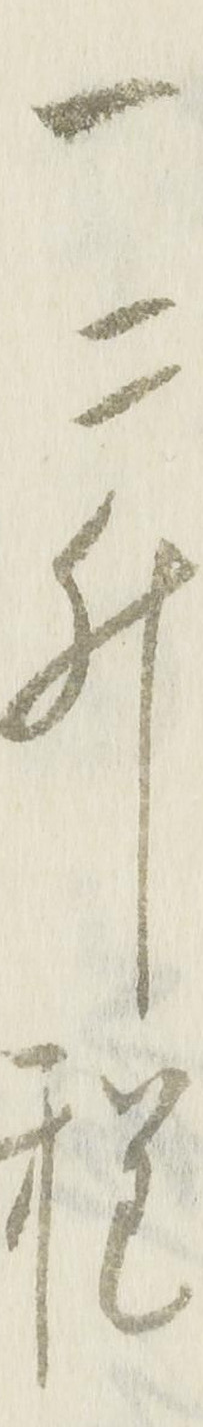一二升程
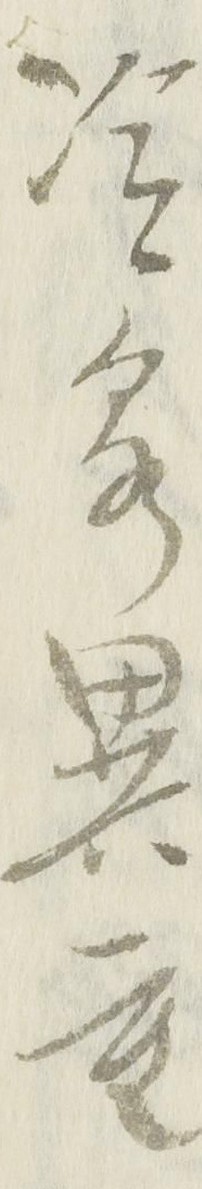冷泉異重

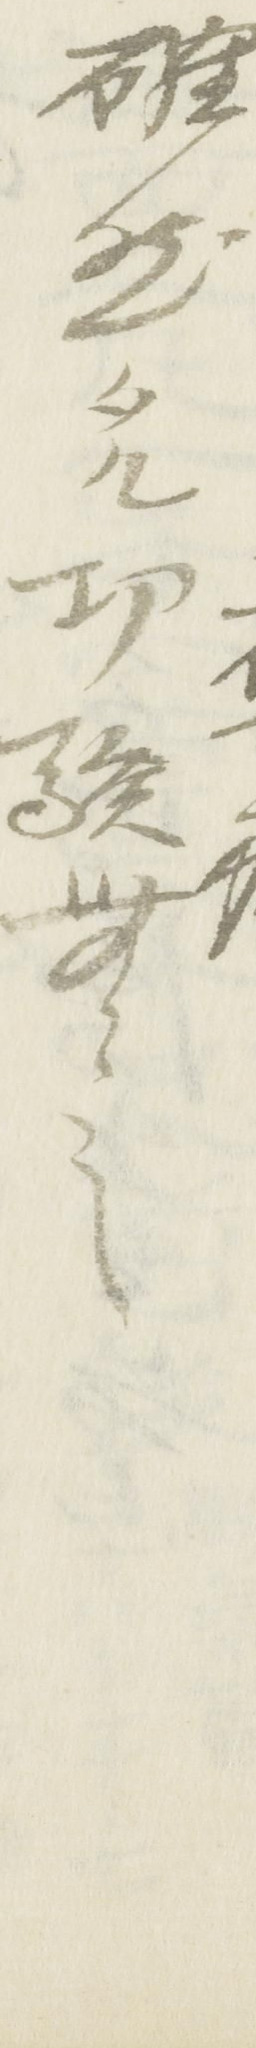確然タル功験無之
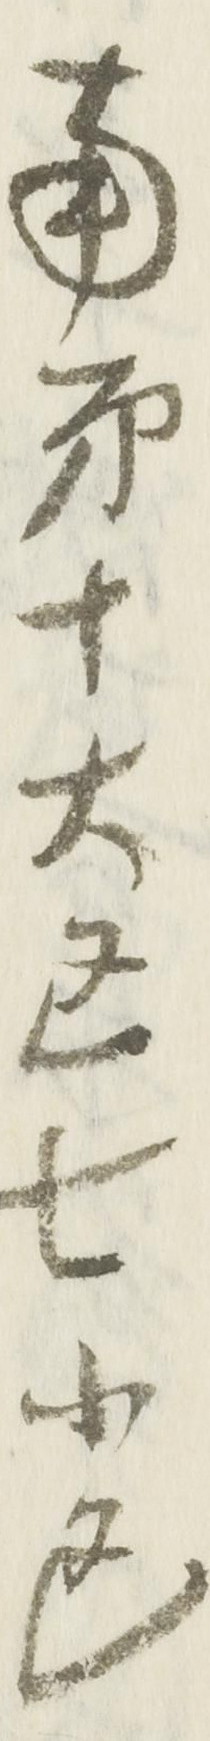南第十大区七小区
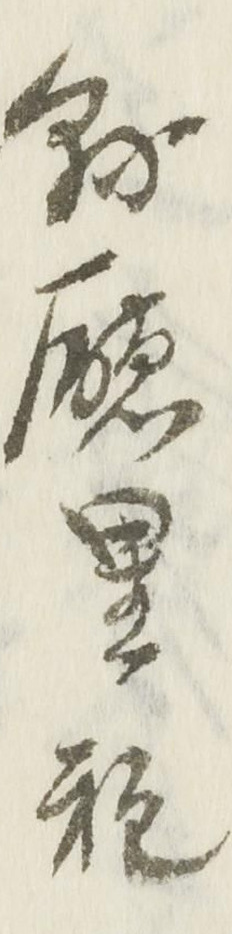県庁里程
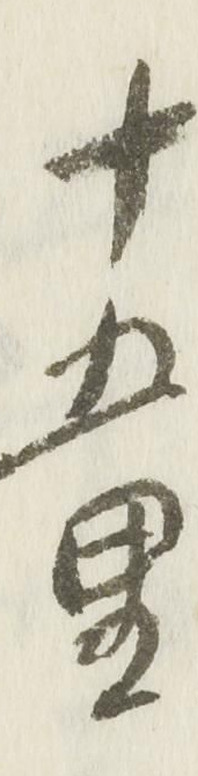十五里
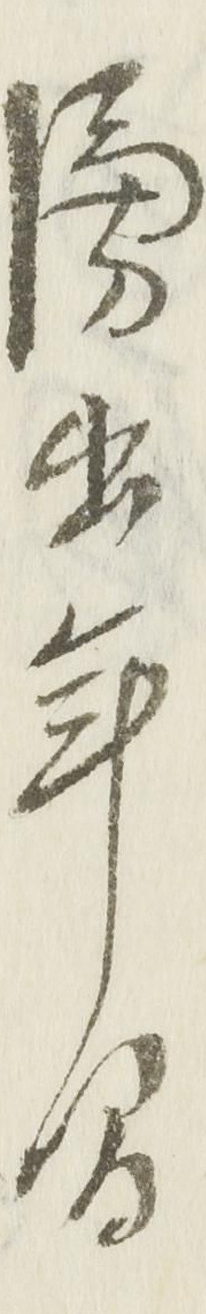湧出年間
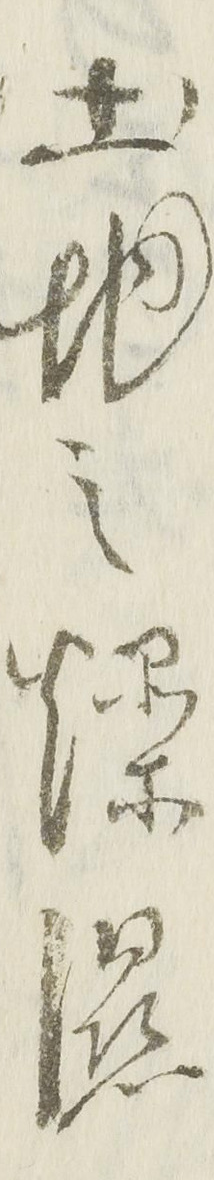土地之燥湿

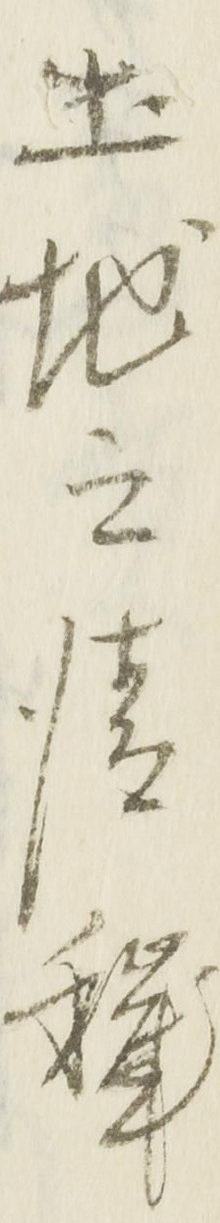土地之清穢
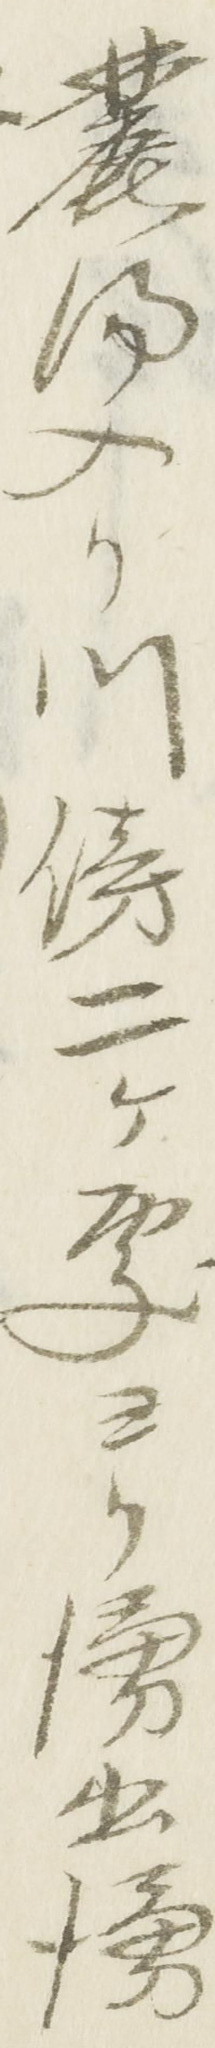麓場入リ川傍ニケ処ヨリ湧出湧
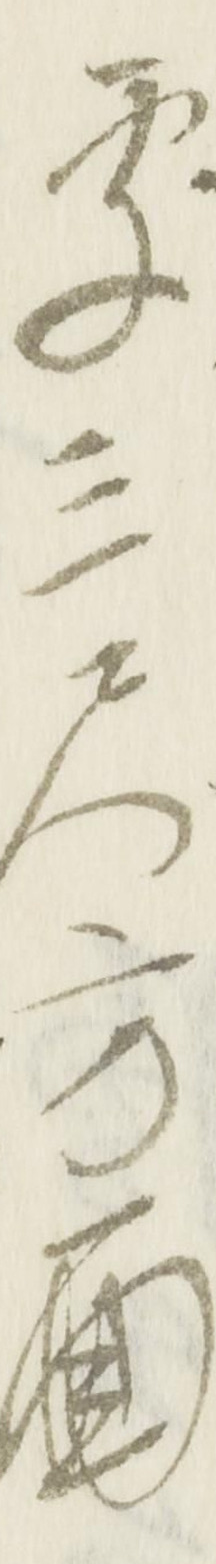処三尺方面
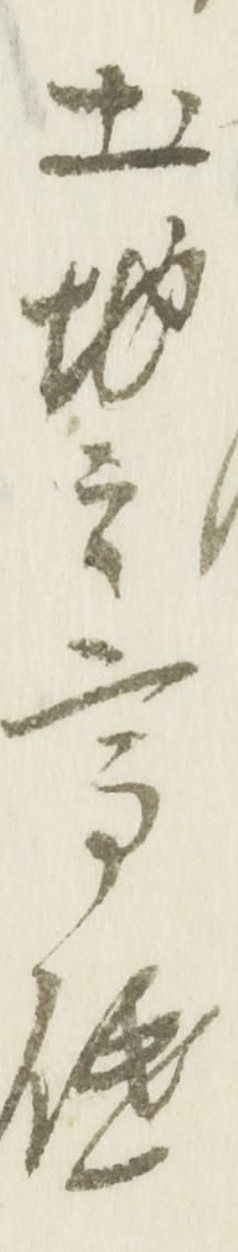土地之高低
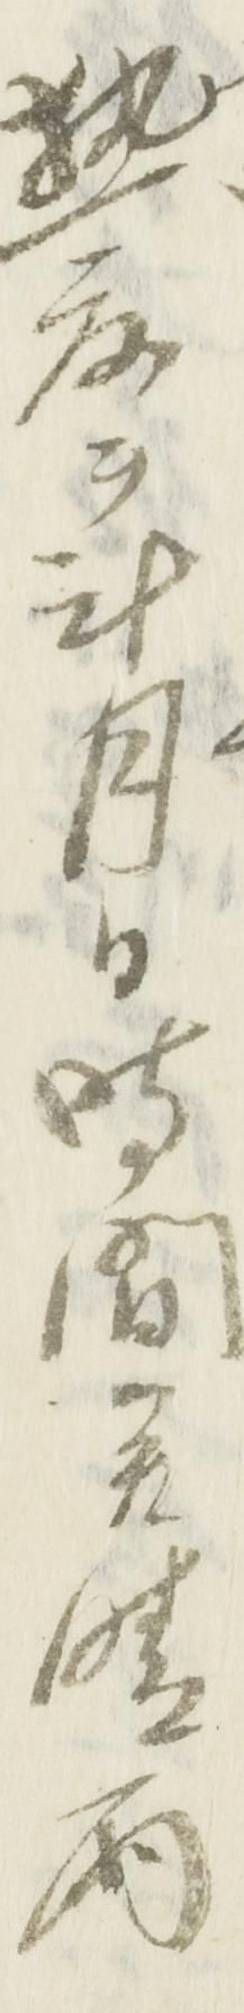熱度ヲ計ル月日時間幷晴雨
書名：温冷泉試験表
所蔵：東京大学地震研究所図書室 Earthquake Research Institute Library, The University of Tokyo, JAPAN
